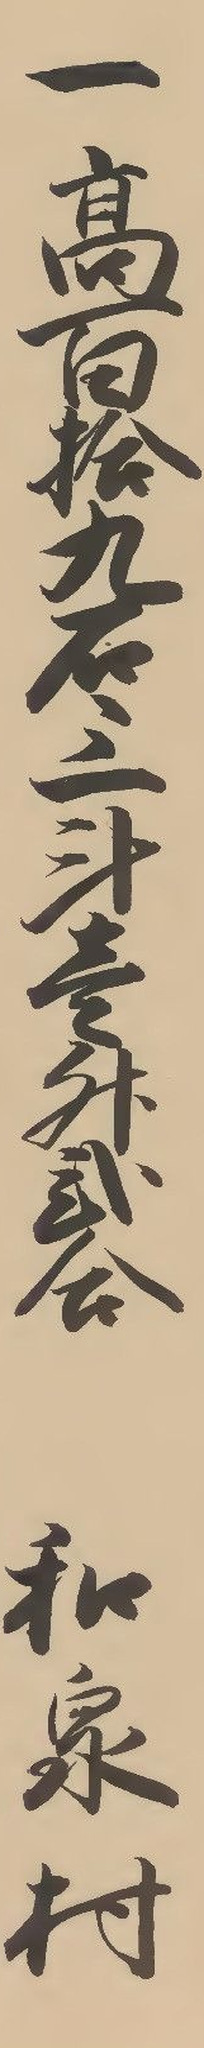一高百拾九石三斗壱升弐合和泉村
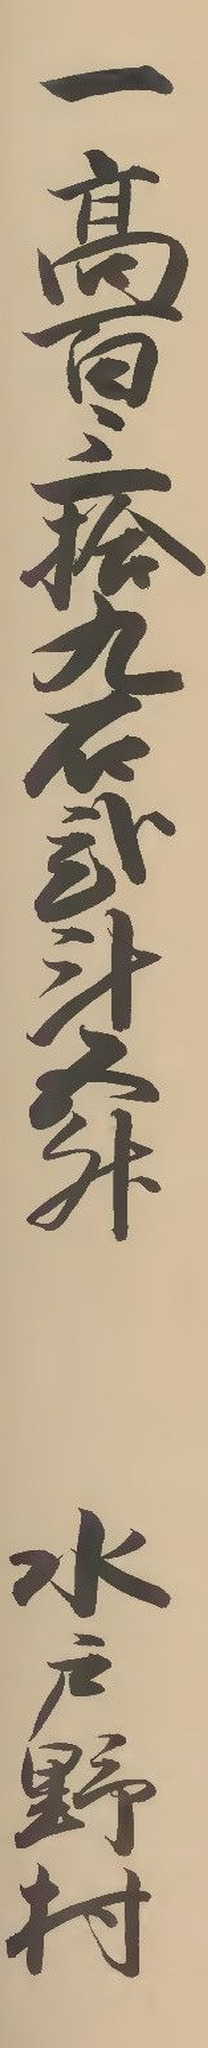一高百三拾九石弐斗五升水戸野村
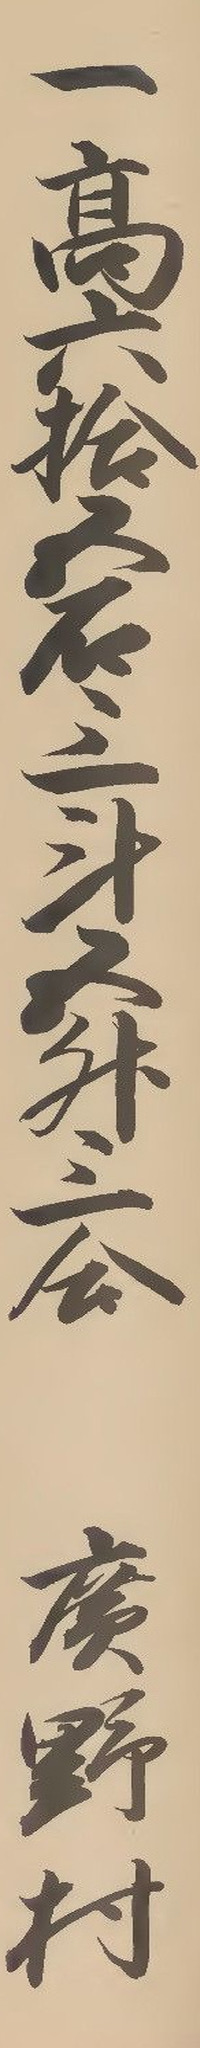一高六拾五石三斗五升三合広野村
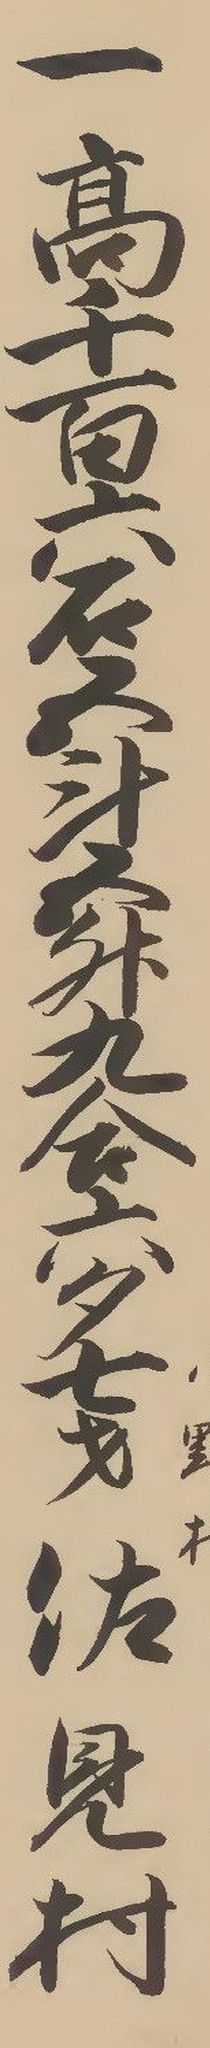一高千百六石五斗五升九合六勺七才佐見村
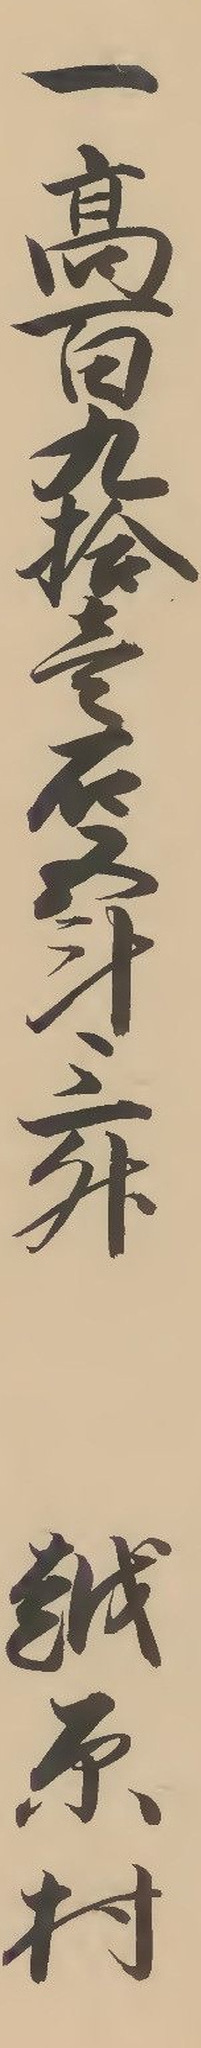一高百九拾壱石五斗三升越原村

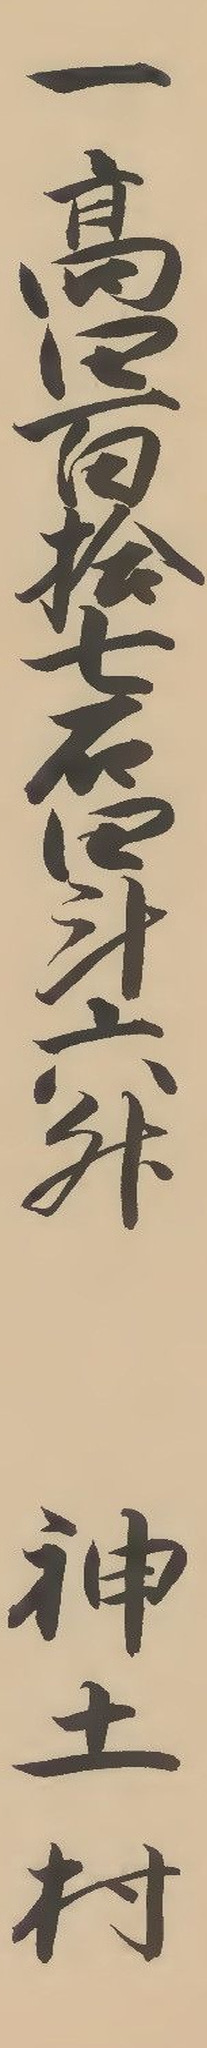一高四百拾七石四斗六升神土村
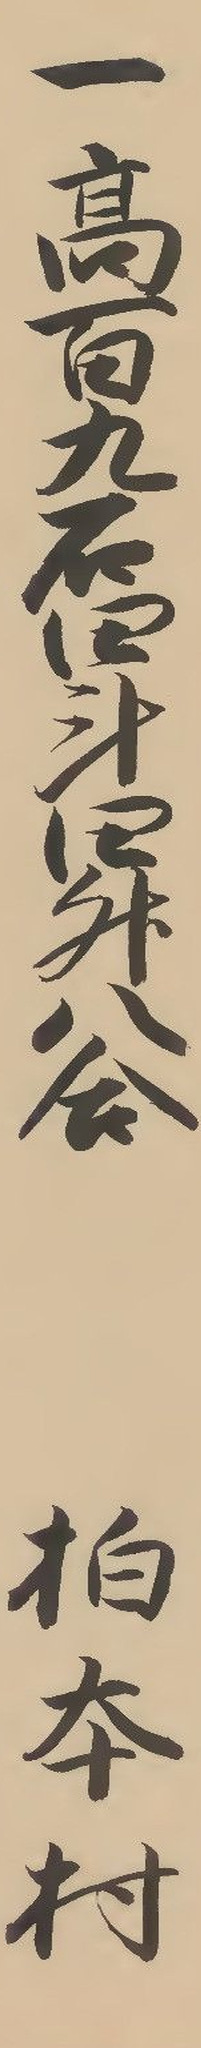一高百九石四斗四升八合柏本村
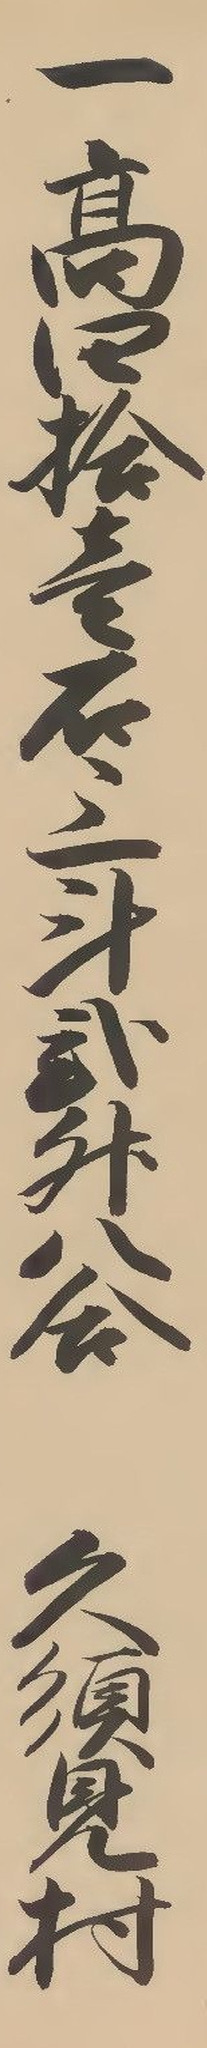一高四拾壱石三斗弐升八合久須見村
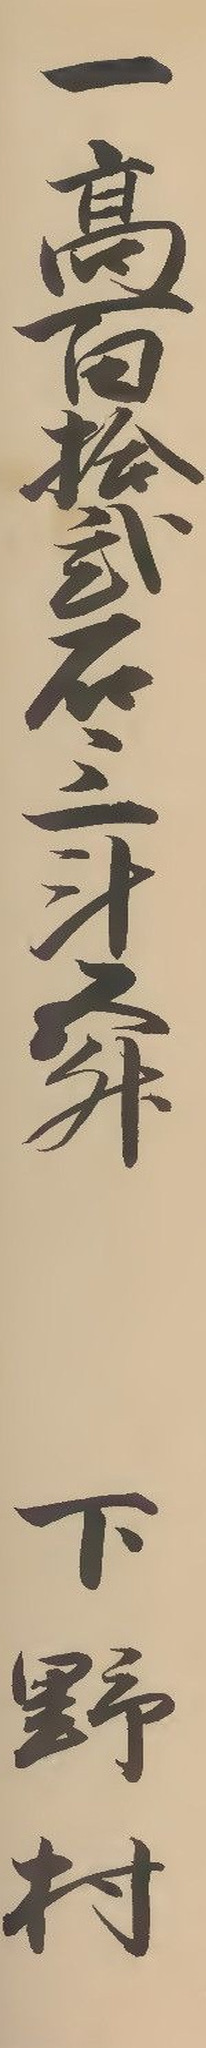一高百拾弐石三斗五升下野村
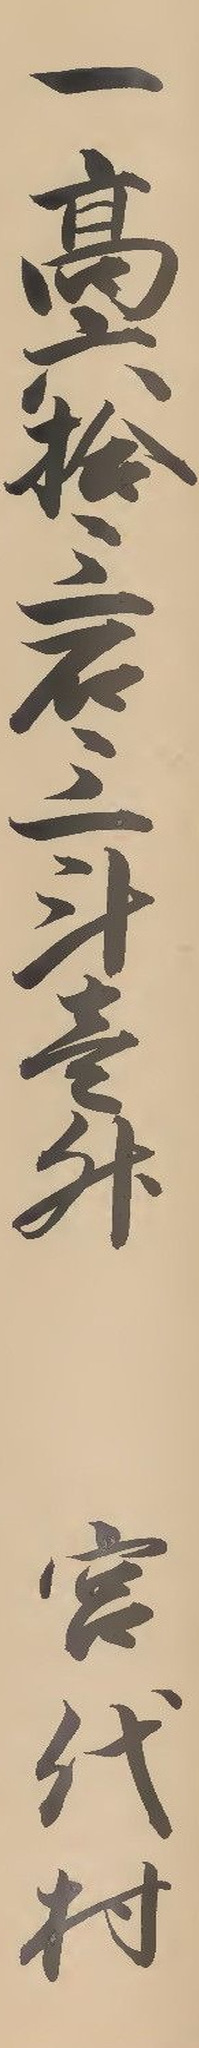一高六拾三石三斗壱升宮代村
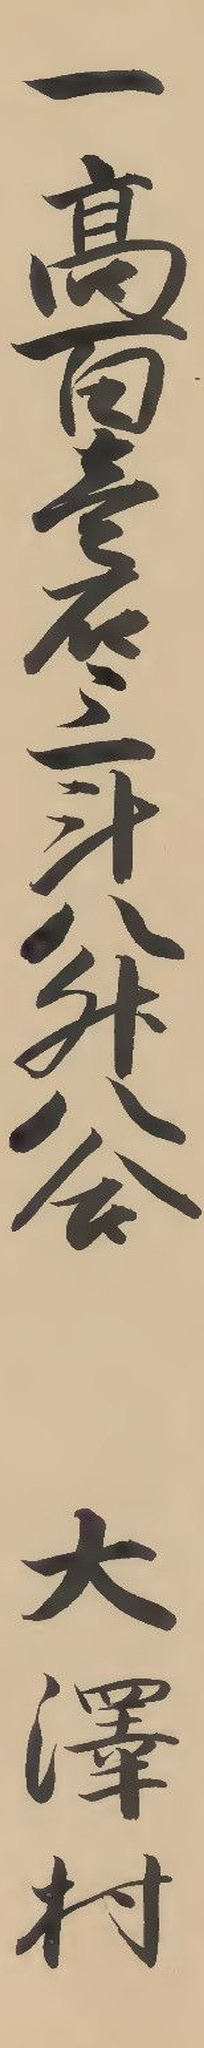一高百壱石三斗八升八合大沢村
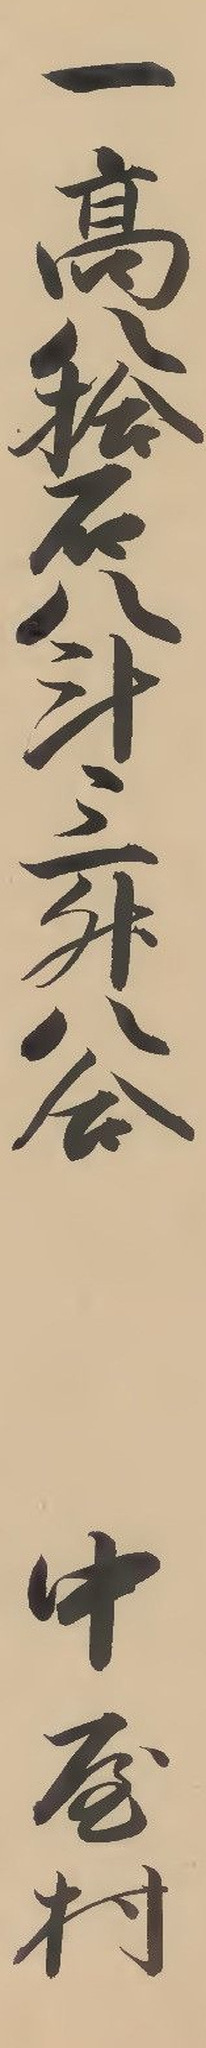一高八拾石八斗三升八合中屋村
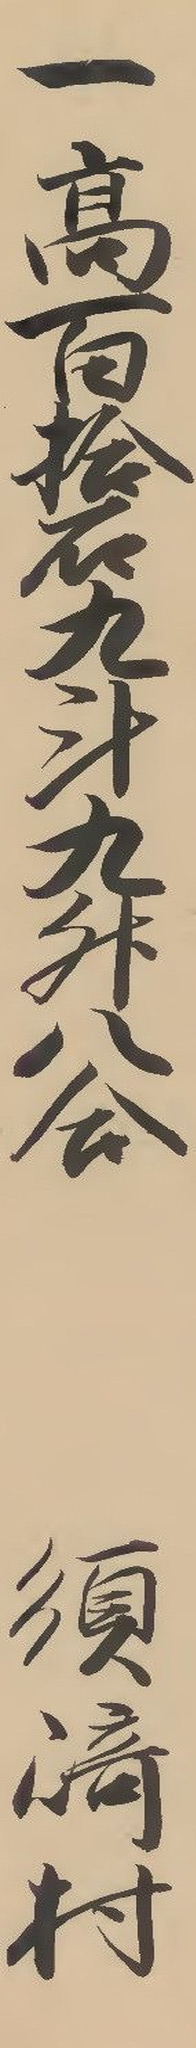一高百拾石九斗九升八合須崎村

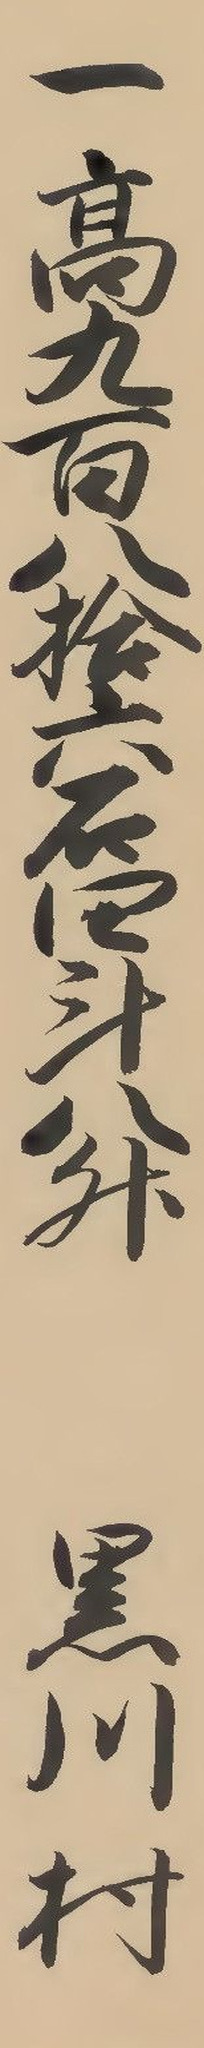一高九百八拾六石四斗八升黒川村
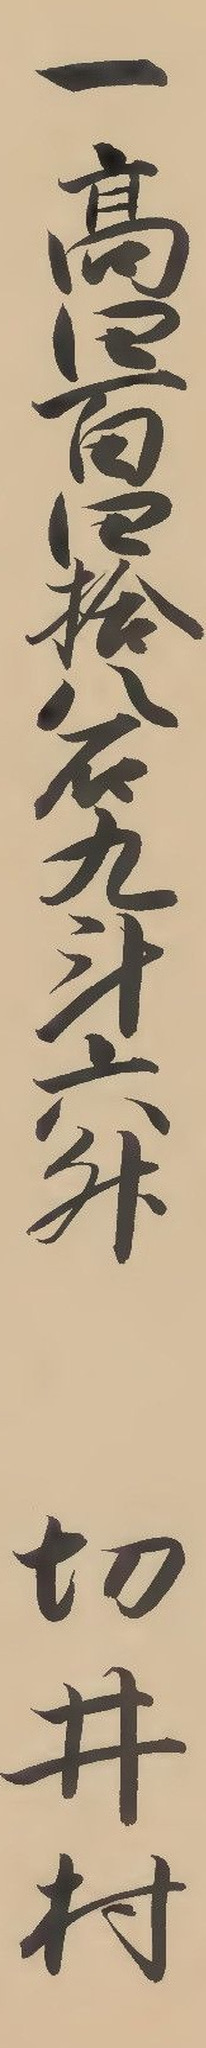一高四百四拾八石九斗六升切井村
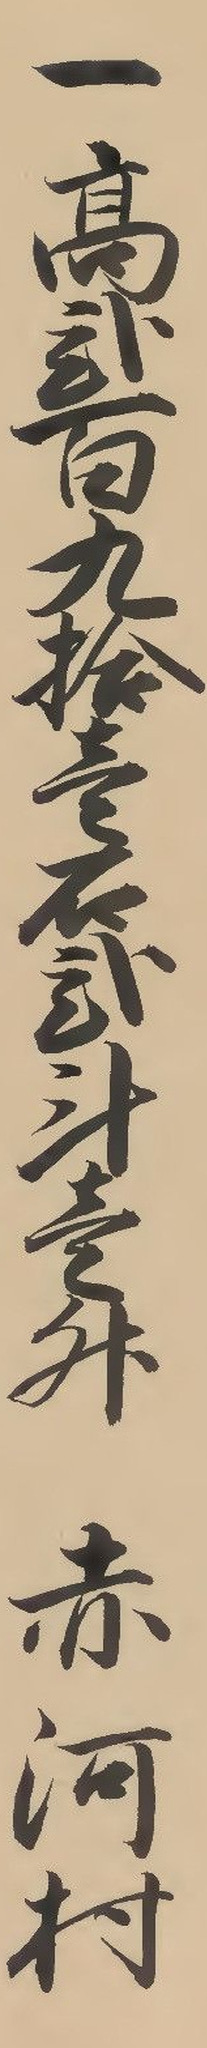一高弐百九拾壱石弐斗壱升赤河村
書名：美濃国郷帳
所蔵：国立公文書館 National Archives of Japan
